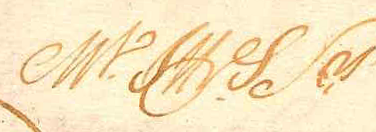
Mto. Ill.es S.res
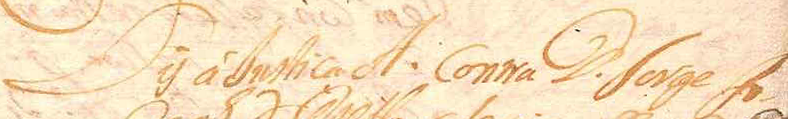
Dis a Iustiça A. Contra D. Jorge Jo
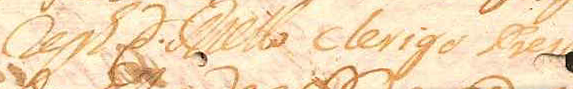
zeph d̄ Mello clerigo Pres
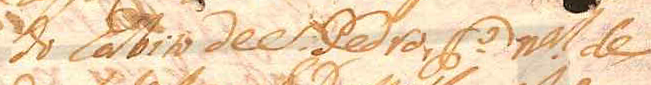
do habito de S Pedro, f.o na.l de
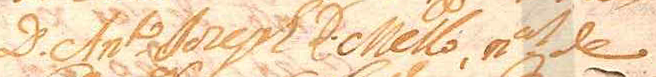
D. An.to Jozeph d̄ Mello, nal. de
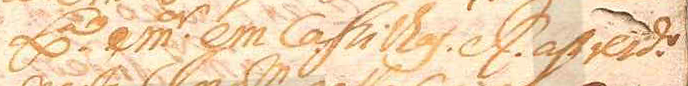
Lx.a e m.or em Cassilhas. R. aprezd.o
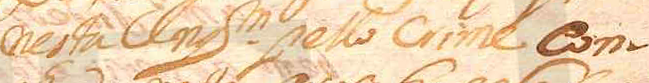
nesta Inq.m pello crime con
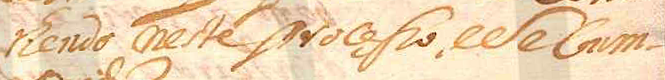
theudo neste processo, e Se Cum
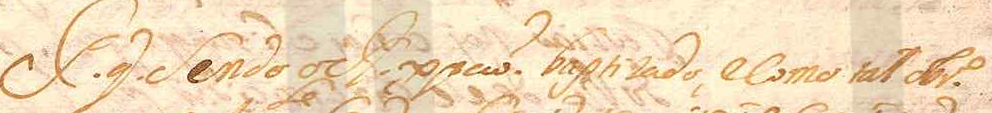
P. q̄ Sendo o R. xpaõ. baptizado, e como tal obr.o
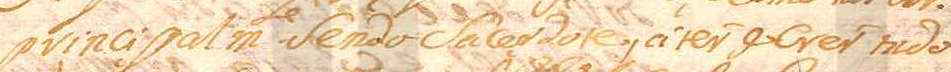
principalm.te sendo Sacerdote, á ter e crer tudo
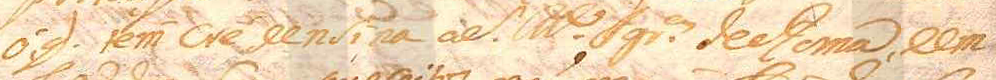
o q̄. tem cré, e ensina a S. M.e Igr.a de Roma, e em
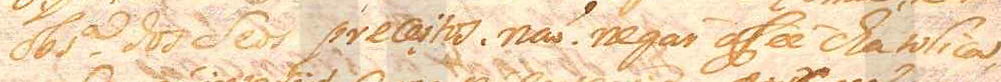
obsa. dos Seos preceitos. naõ negar a feé chatolica
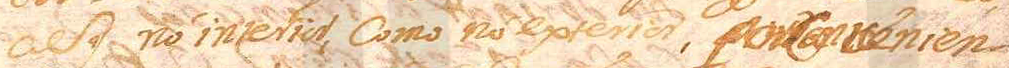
asy no interior, como no exterior, por Conuenien
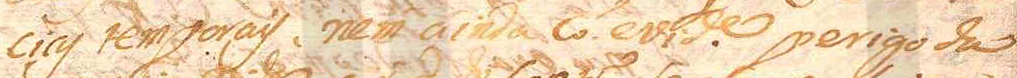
cias temporais, nem ainda cō evid.e perigo da
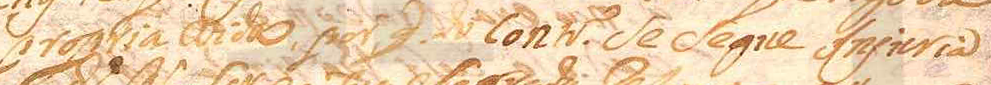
propria vida porq̄ do contr.o se segue Injuria
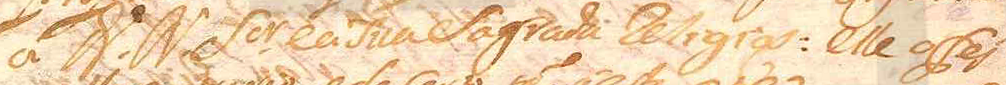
a D.s N. S.or e a sua Sagrada Religiaõ: elle o fes
